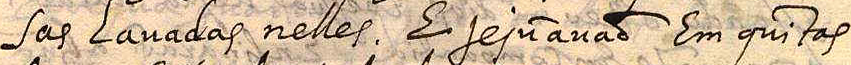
sas Lauadas nelles. E Jejūauão Em quītas
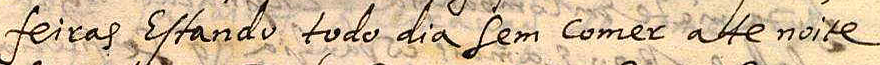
feiras Estando todo dia sem comer ate noite
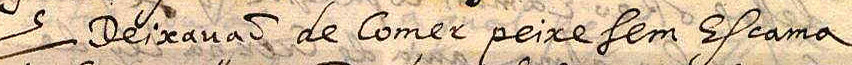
E Deixauaõ de Comer peixe sem Escama
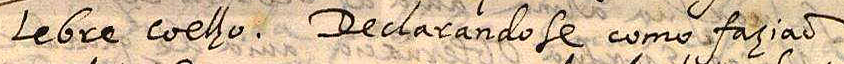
Lebre coelho. Declarando se como faziaõ
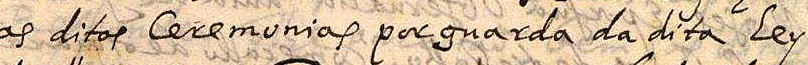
as ditas Ceremonias por guarda da dita Ley
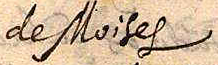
de Moises
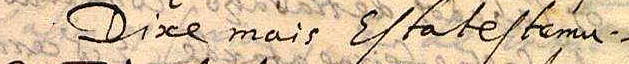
Dixe mais Esta testemu
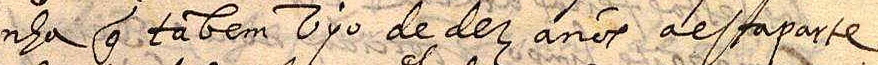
nha q̄ tābem vyo de dez anōs a esta parte
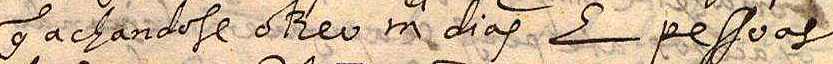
q̄ achandose o Reo mel dias E pessoas
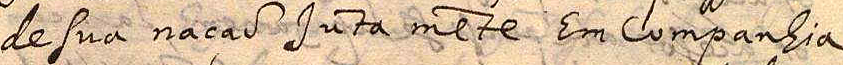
de sua naçaõ Jūtamēte Em Companhia
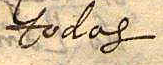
todas
